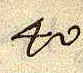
40
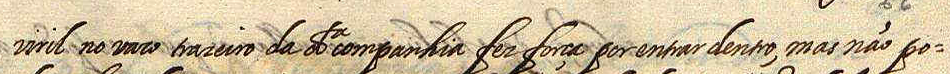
viril no vazo trazeiro da d̄a companhia fez força por entrar dentro, mas não po
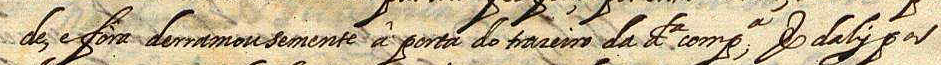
de, e fora derramou semente a porta do trazeiro da d̄a compa, & daly por
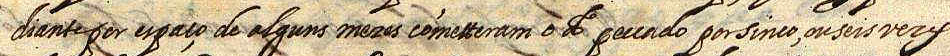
diante por espaço de alguns mezes cometteram o d̄o peccado por sinco, ou seis vezes
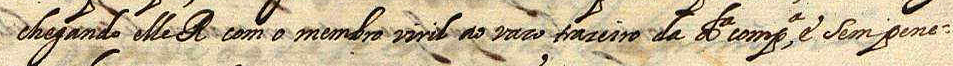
chegando elle R com o membro viril ao vazo trazeiro da d̄a compa, e Sem pene
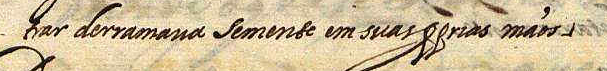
trar derramaua semente em suas ꝓprias maõs
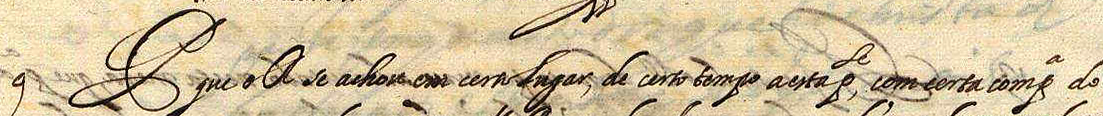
9 P que o R se achou em certo lugar, de certo tempo a esta pte, com certa compa do
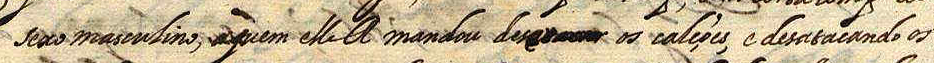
sexo masculino, a quem elle R mandou des_ os calções, e desatacando os
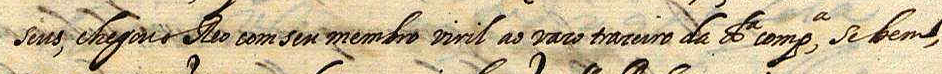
seus, chegou o Reo com seu membro viril ao vazo trazeiro da d̄a compa, se bem,
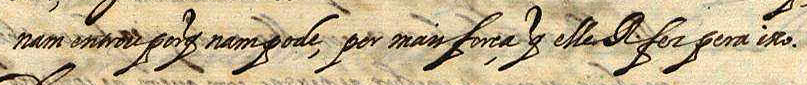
nam entrou porq̄ nam pode, por mais força q̄ elle R. fez pera isso.
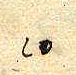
10
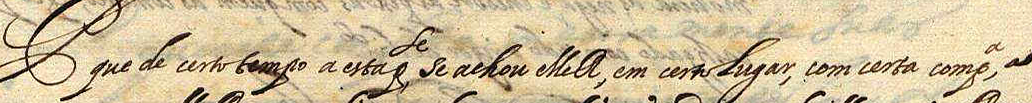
P que de certo tempo a esta pte se achou elle R, em certo Lugar, com certa compa, a
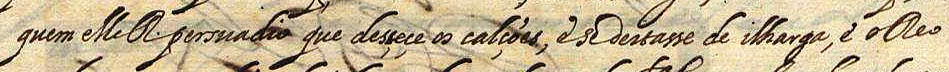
quem elle R. persuadio que dessece os calções, e se deitasse de ilharga, e o Reo
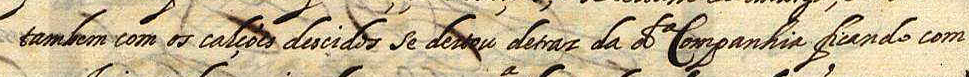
tambem com os calções descidos se deitou detraz da d̄a Companhia ficando com
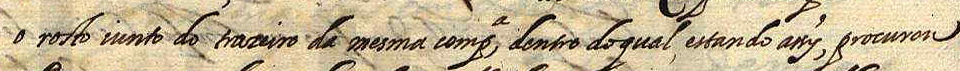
o rosto iunto do trazeiro da mesma compa, dentro do qual, estando assy, procurou
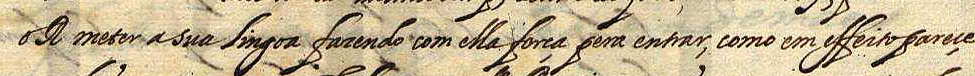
o R meter a sua lingoa fazendo com ella força pera entrar, como em effeito parece
